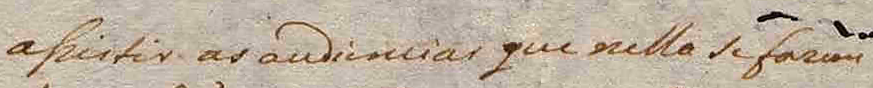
assistir as audiencias que nella se fazem
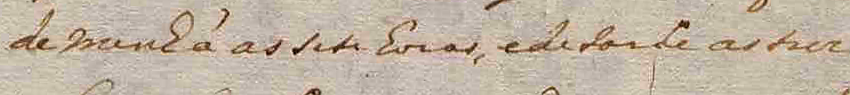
de manhã as sete horas, e de tarde as trez
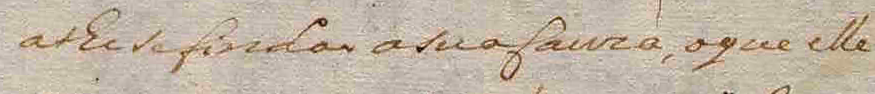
athe se findar a sua Cauza, o que elle
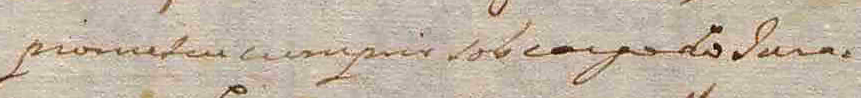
prometeu cumprir sob cargo do Iura
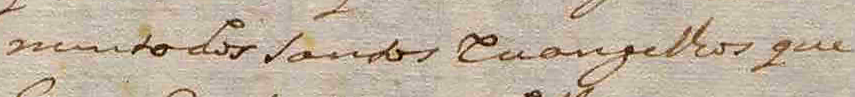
mento dos santos Euangelhos que
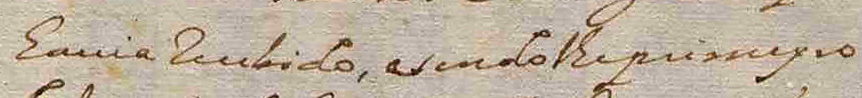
hauia Recebido, e sendolhe primeyro
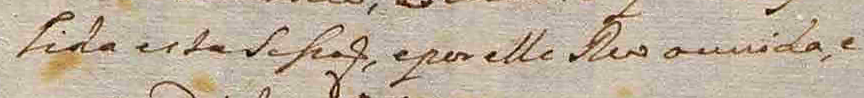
lida esta Sessaõ, e per elle Reo ouuida, e
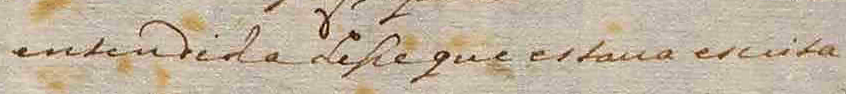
entendida disse que estaua escrita
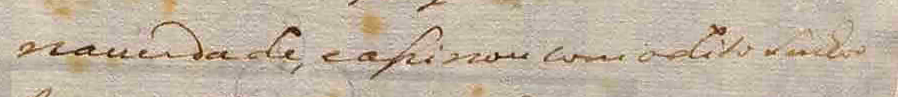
na uerdade, e assinou com o dito senhor
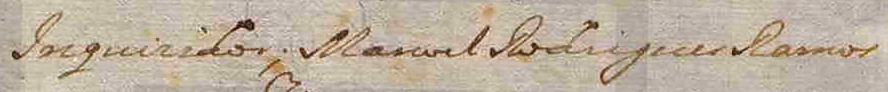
Inquizidor Manoel Rodrigues Ramos
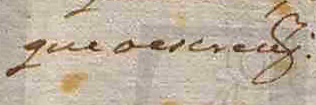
que o escreuj.
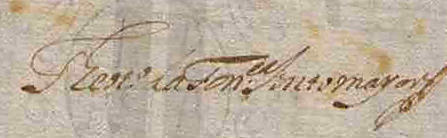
Theot.o da Fon.ca Soutomayor
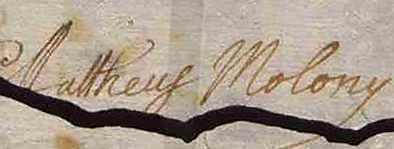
Matheus Molony
